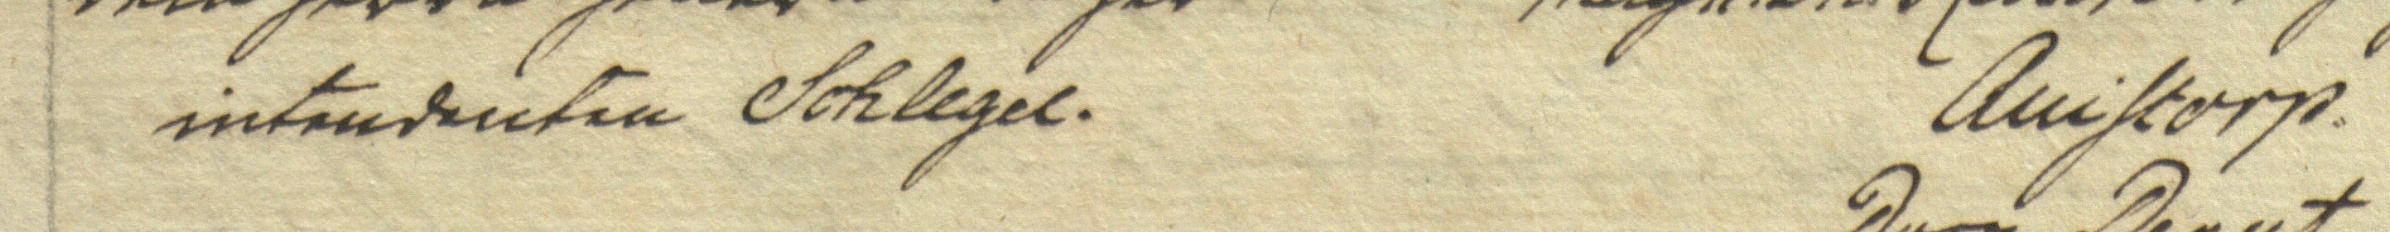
intendenten Schlegel. Quistorp.
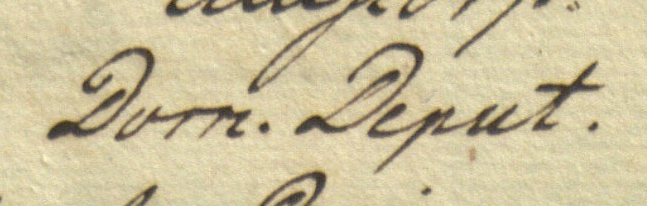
Dom. Deput.
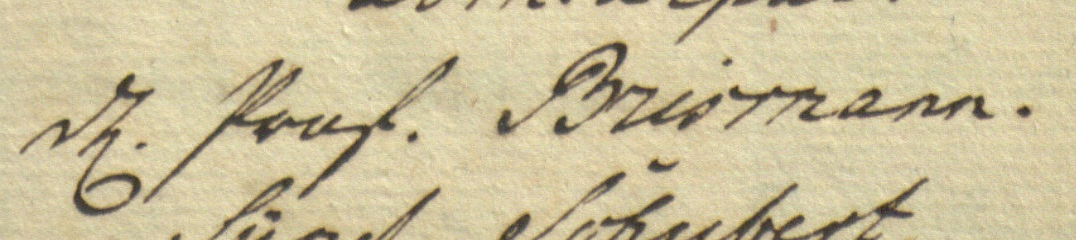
dh. Prof. Brismann.
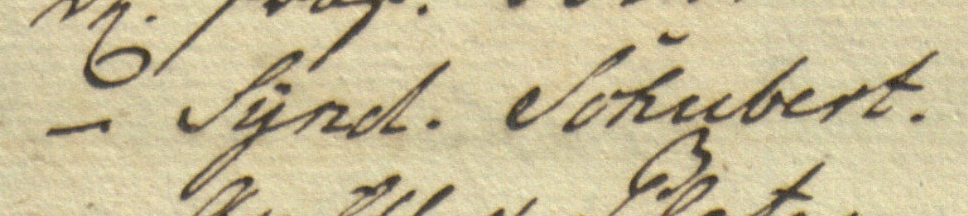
Sÿnd. Schubert.
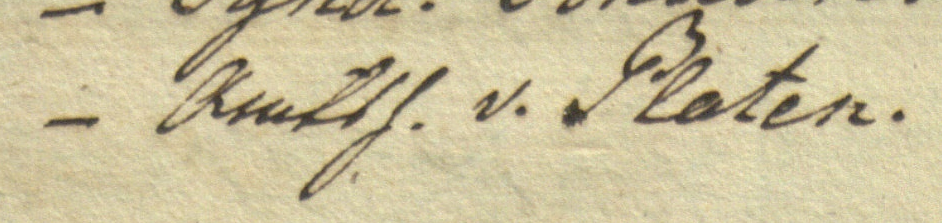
Amtsh. v. Platen.
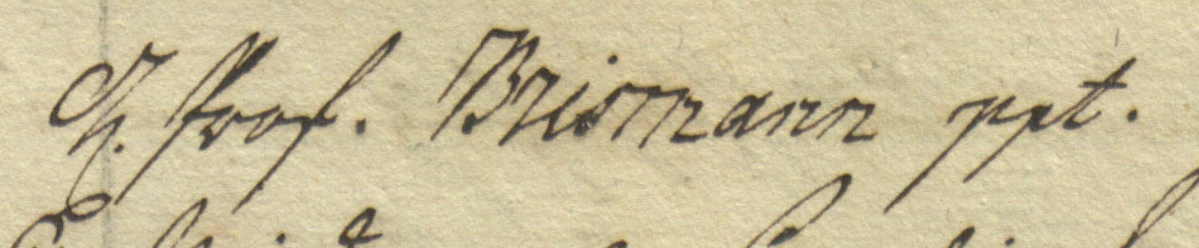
dh. Prof. Brismann ppt.
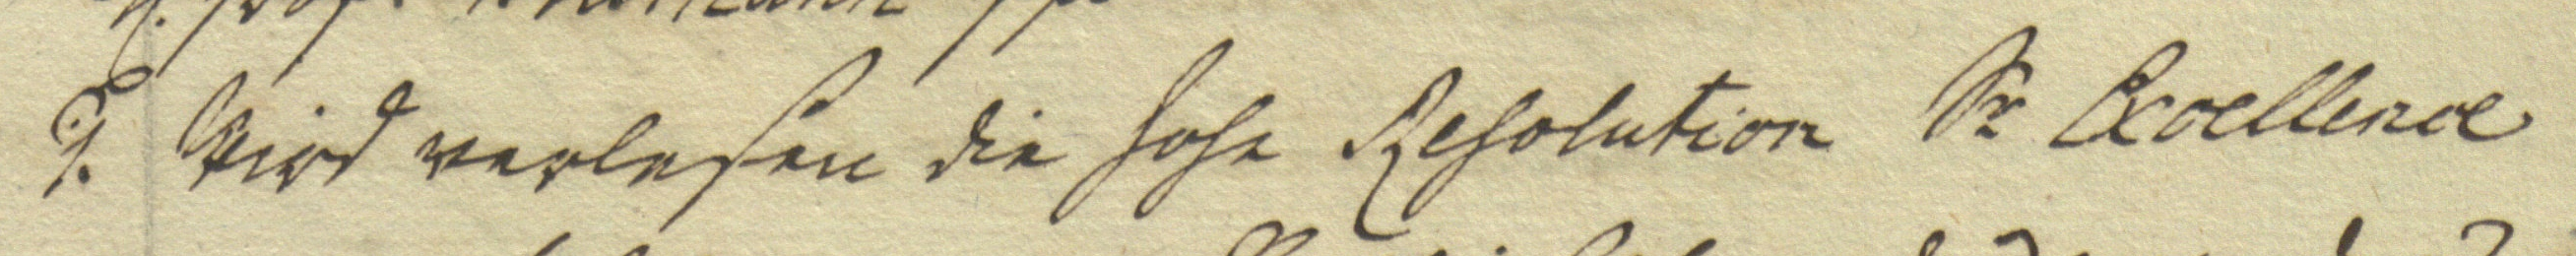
1. Wird verlesen die Hohe Resolution Sr Excellence
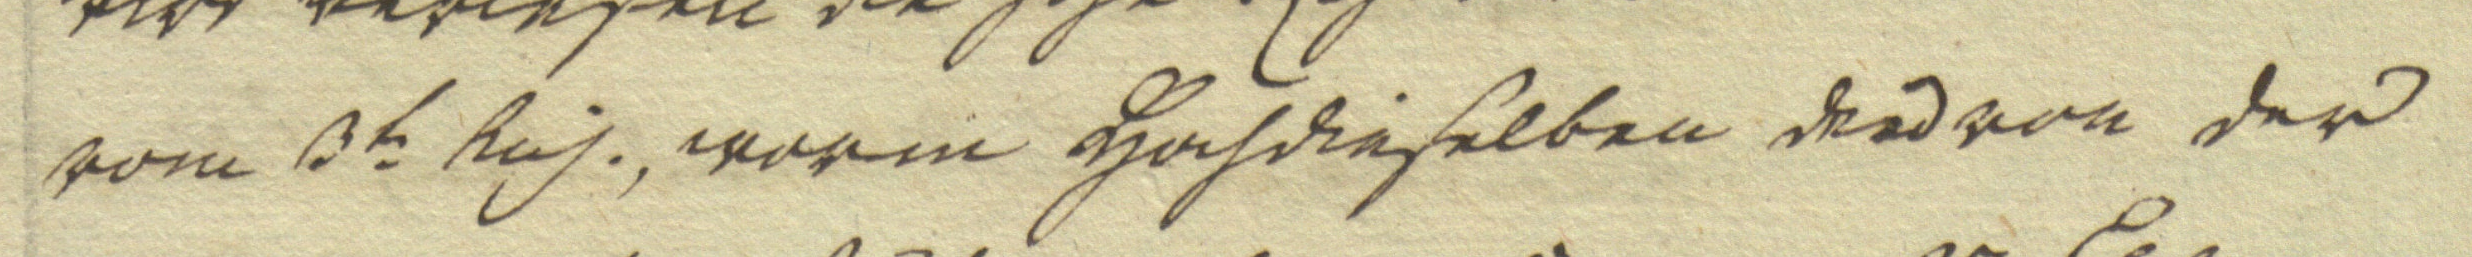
vom 3 te huj. worin Hochdieselben den von der
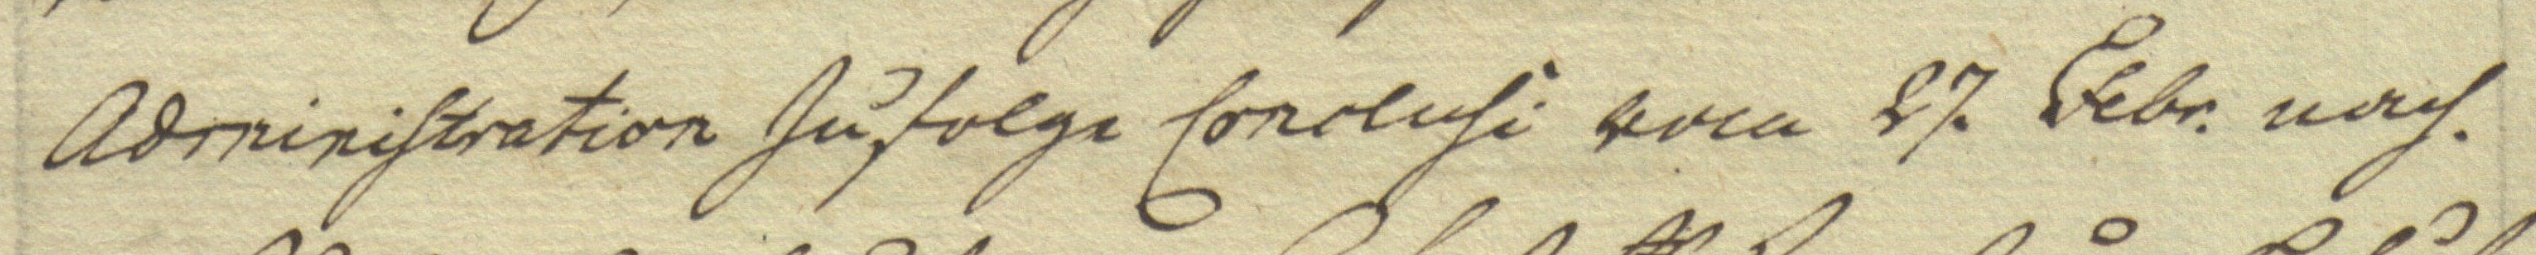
Administration zufolge Conclusi vom 27. Febr. nach¬
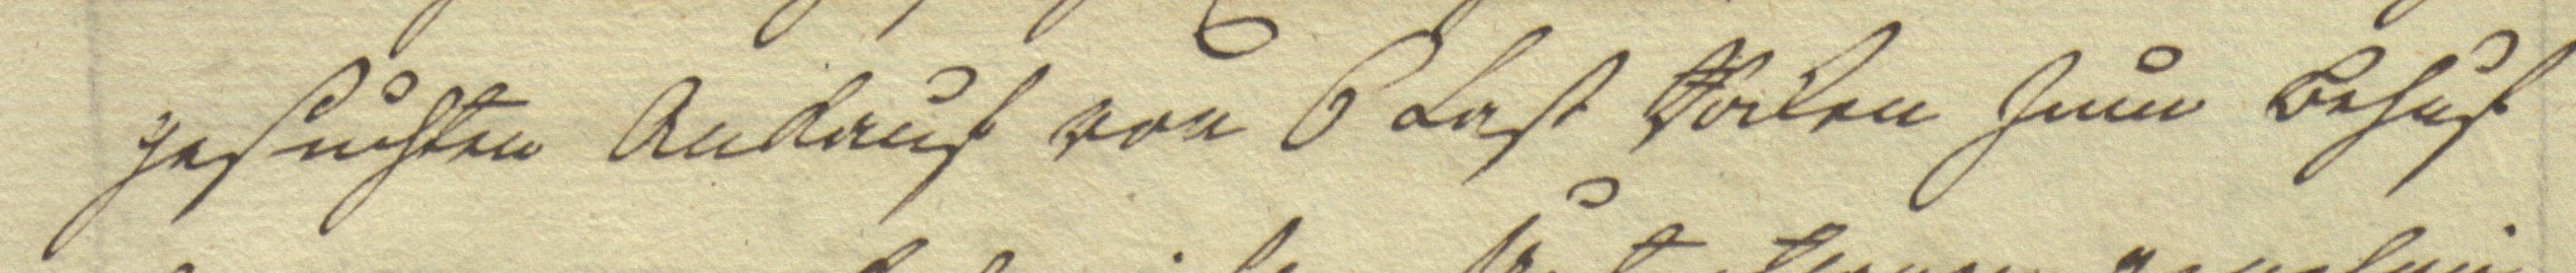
gesuchten Ankauf von 6 Last Rocken zum Behuf
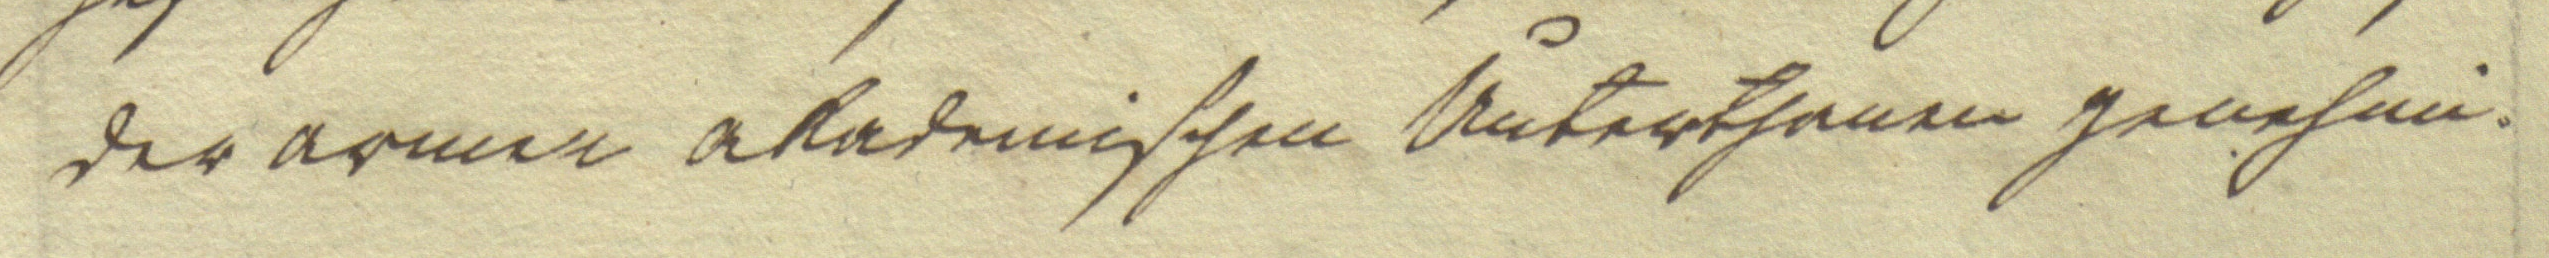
der armen akademischen Unterthanen genehmi¬
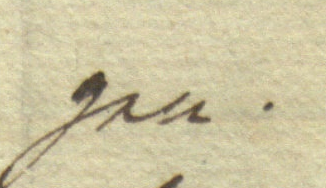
gen.
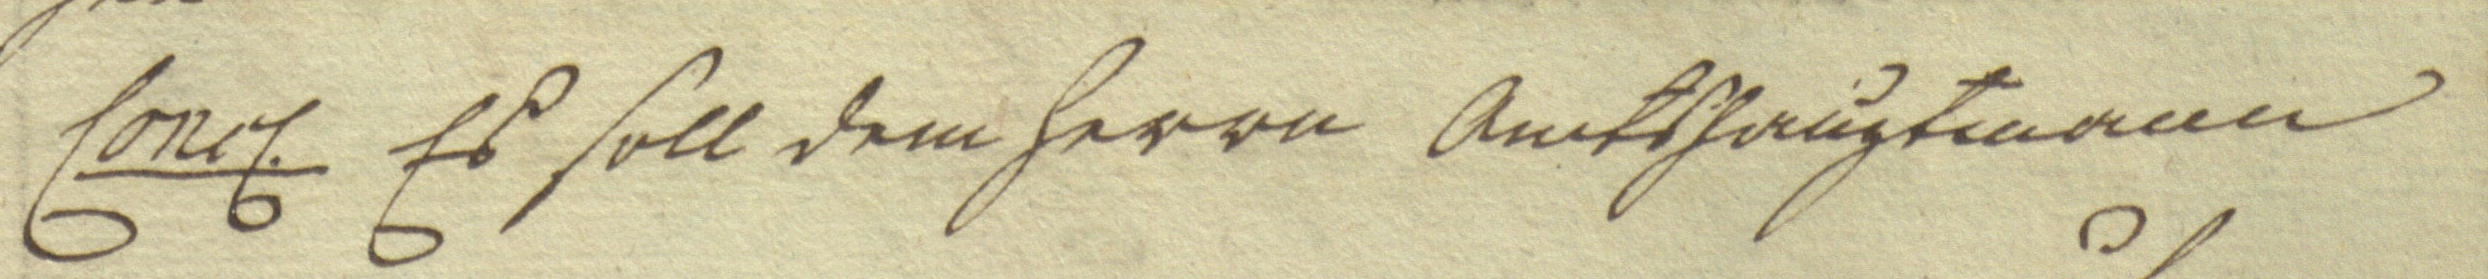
Concl. Es soll dem Herrn Amtshauptmann
